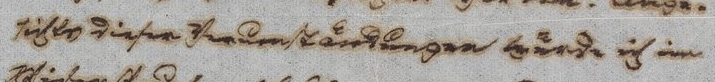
sichts dieser Verumständungen würde ich im
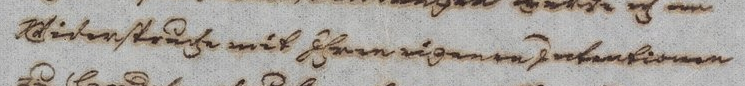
Widerspruche mit Ihren eigenen Intentionen
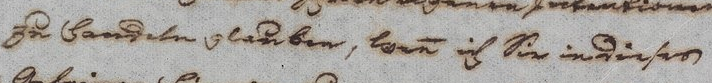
zu handeln glauben, wenn ich Sie in dieses
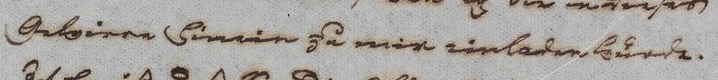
Gewirre hinein zu mir einladen würde.
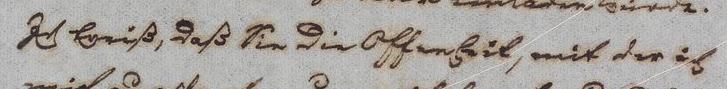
Ich weiß, daß Sie die Offenheit, mit der ich
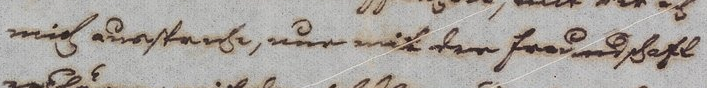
mich ausspreche, nur mit der Freundschaft
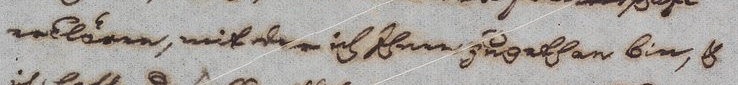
erklären, mit der ich Ihnen zugethan bin, &
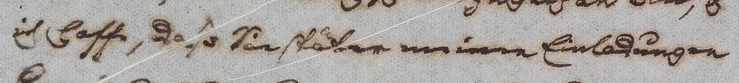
ich hoffe, daß Sie später meinen Einladungen
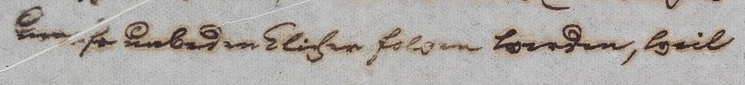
um so unbedenklicher folgen werden, weil
